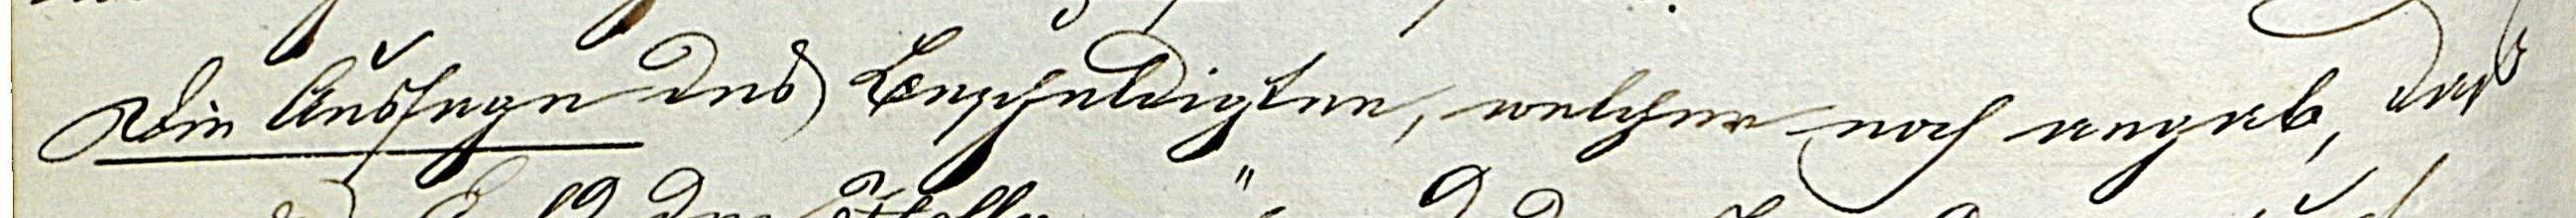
Die Aussage des Beschuldigten, welcher noch angab, das
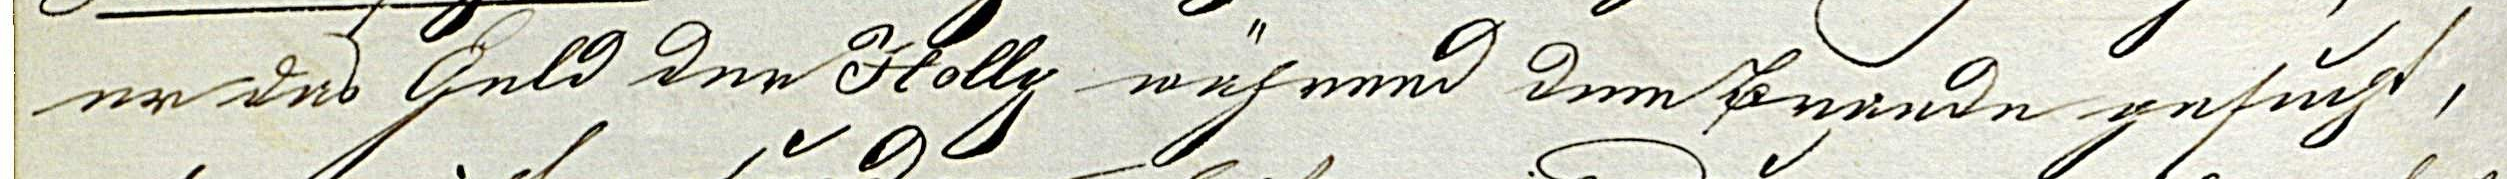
er das Geld der Holly während dem Brande gesucht,
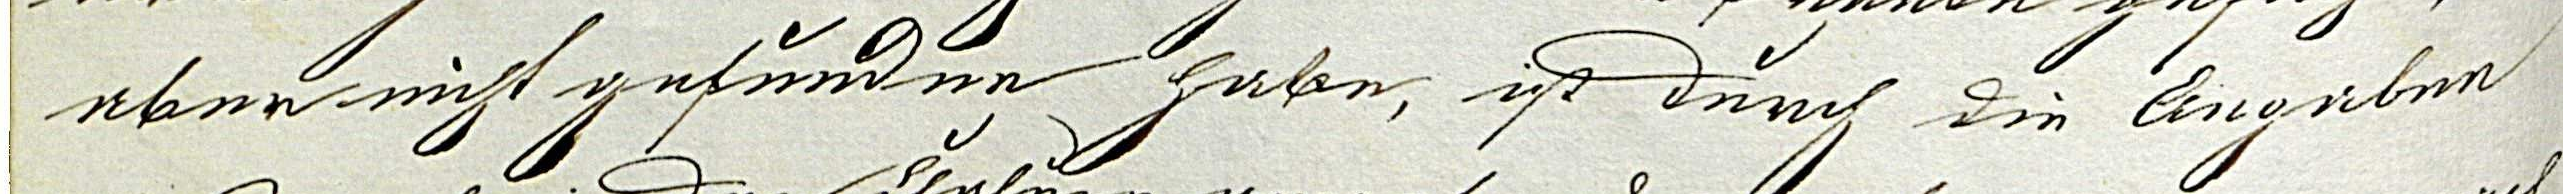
aber nicht gefunden habe, ist durch die Angaben
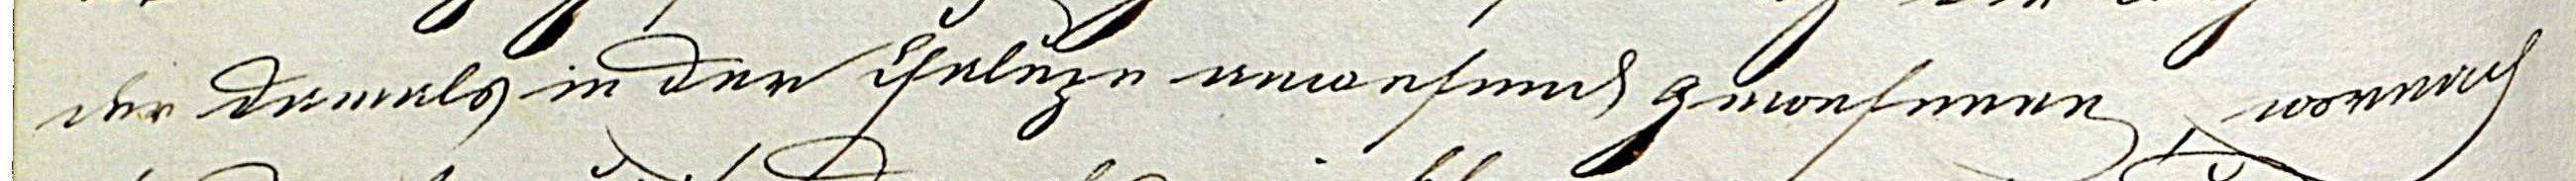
der damals in der Chalupe anwesend gewesenen, wornach
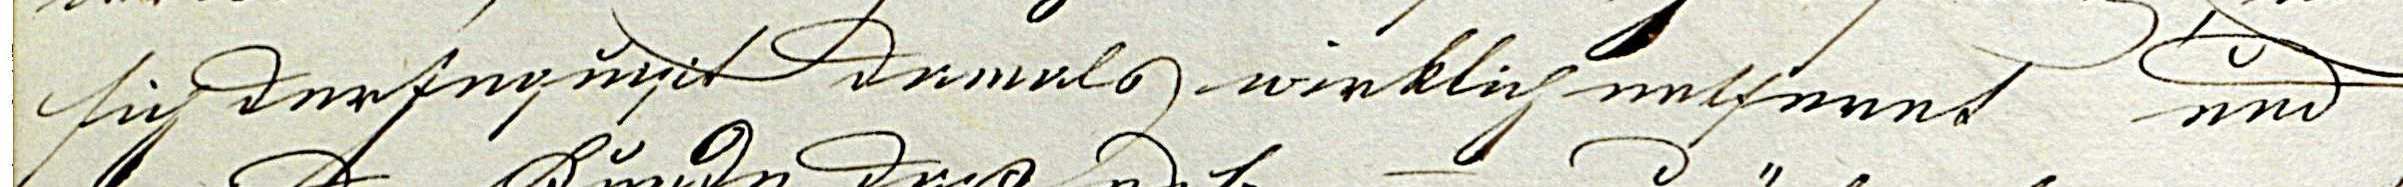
sich der Inquisit damals wirklich entfernt und
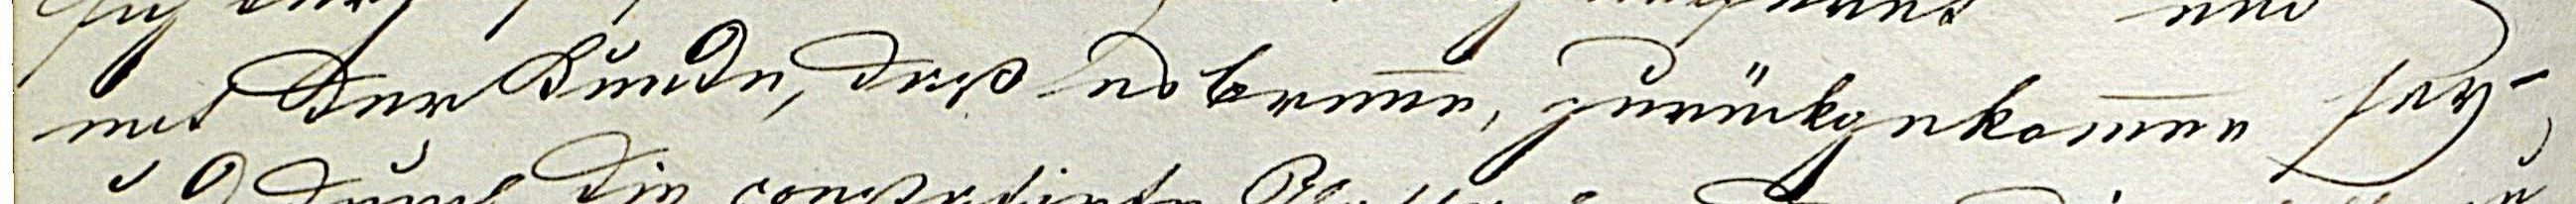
mit der Kunde, daß es brenne, zurückgekommen sey–
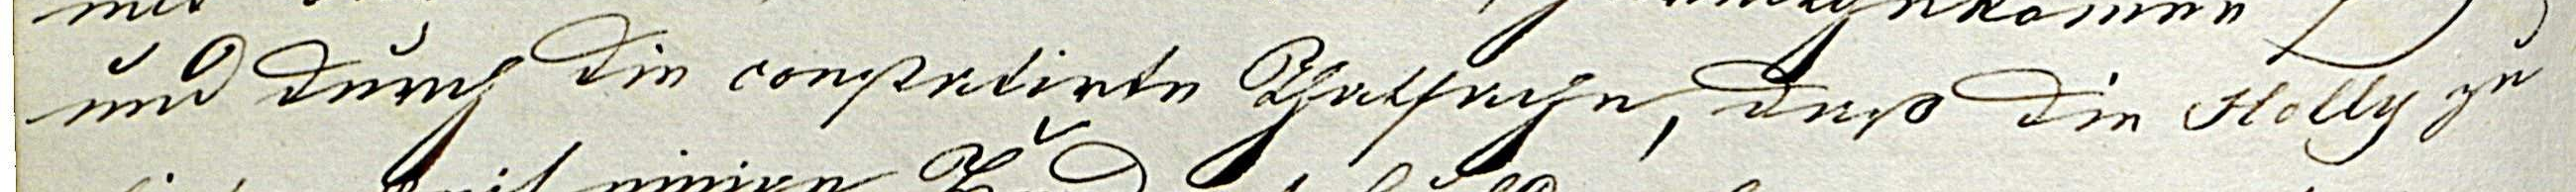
und durch die constatirte Thatsache, daß die Holly zu
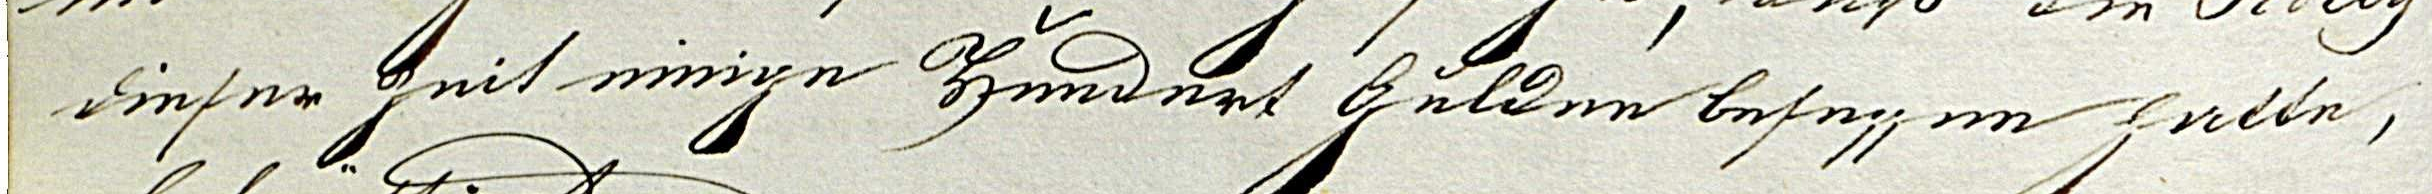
dieser Zeit einige Hundert Gulden besessen hatte,
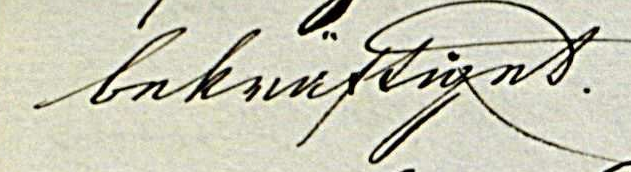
bekräftigt.
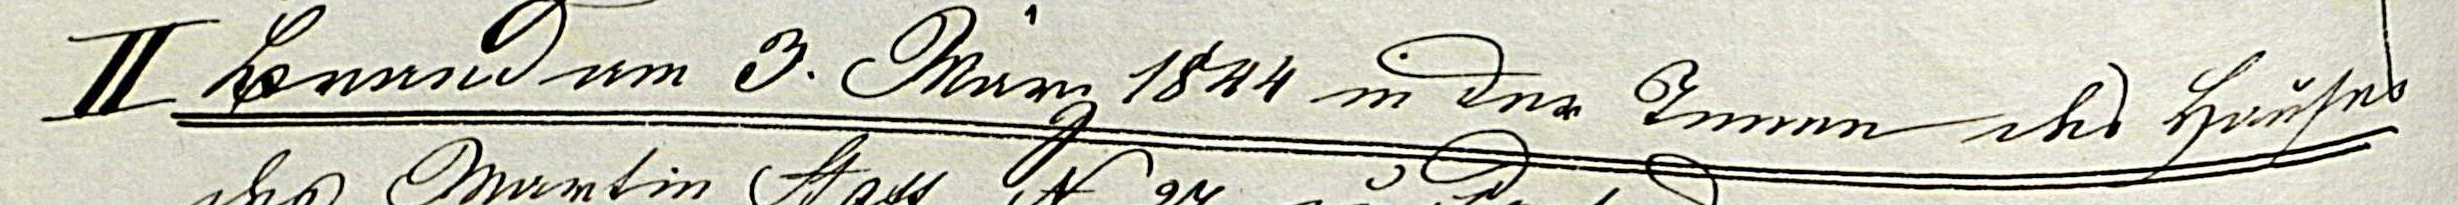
II. Brand am 3. März 1844 in der Tenne des Hauses
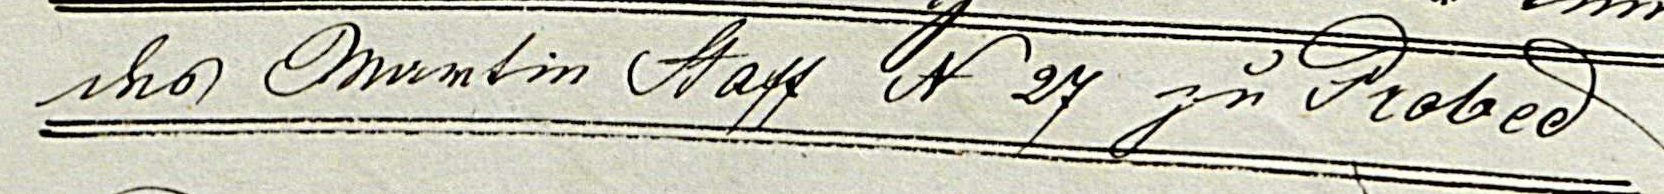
des Martin Staff N. 27 zu Probed
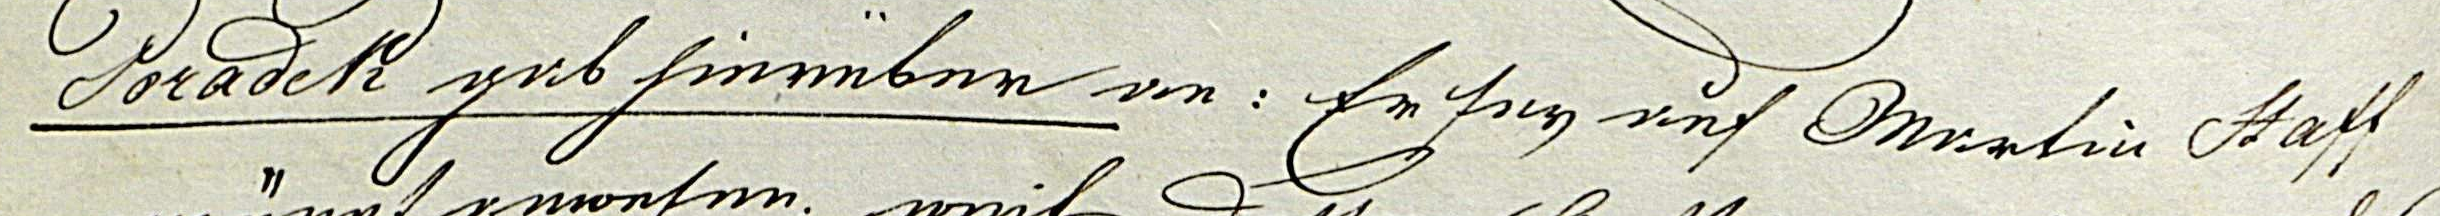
Poradek gab hierüber an: Er sey auf Martin Staff
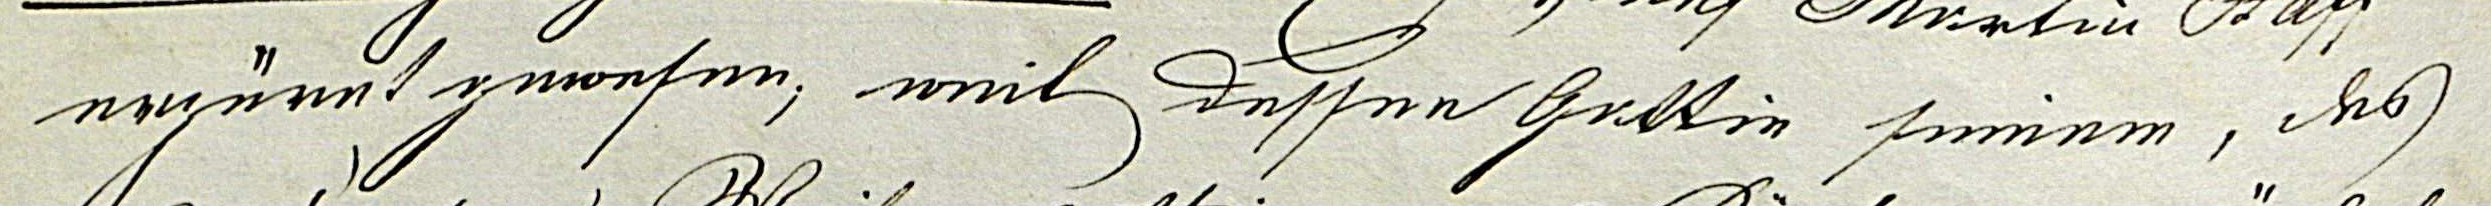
erzürnt gewesen; wel dessen Gattin seinem, des
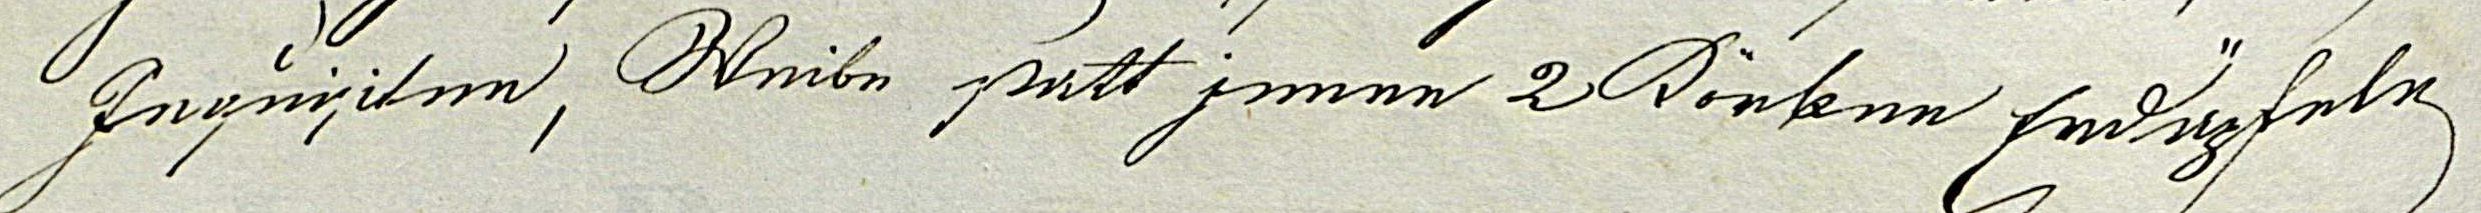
Inquisiten, Weibe statt jenen 2 Körben Erdäpfeln
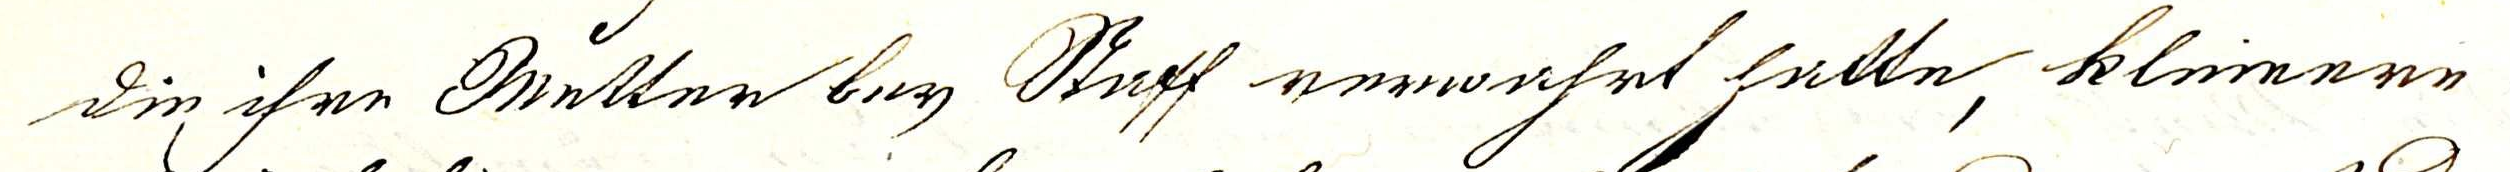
die ihre Mutter bey Staff verwahrt hatte, kleinere
